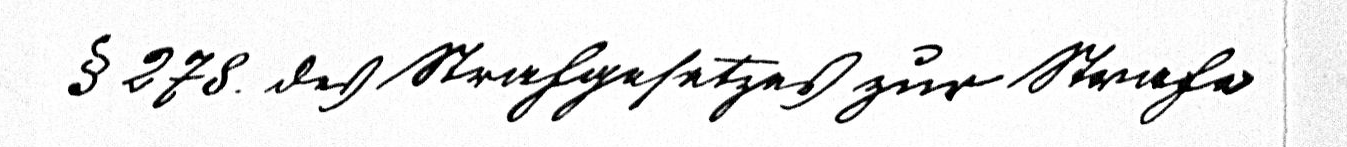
§ 278. des Strafgesetzes zur Strafe
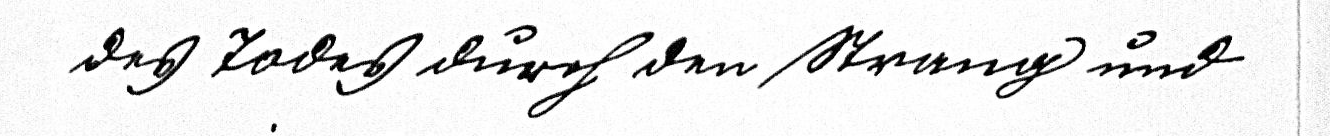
des Todes durch den Strang und
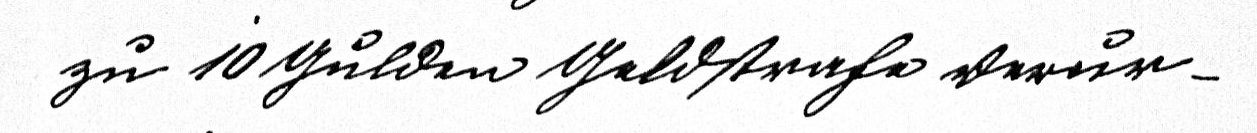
zu 10 Gulden Geldstrafe verur¬
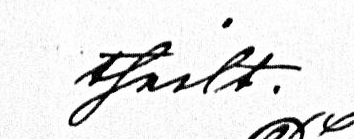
theilt.
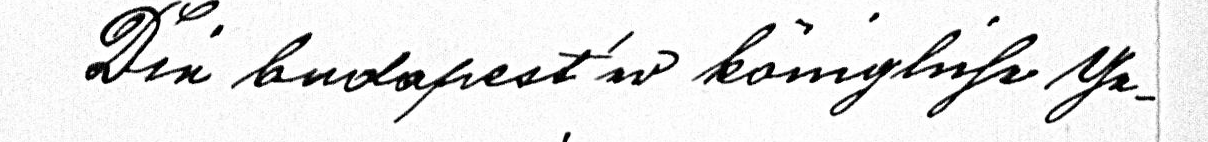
Die bedapest'er königliche Ge¬
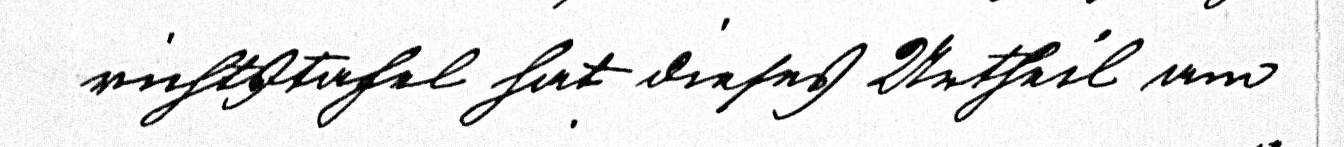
richtstafel hat dieses Urtheil am
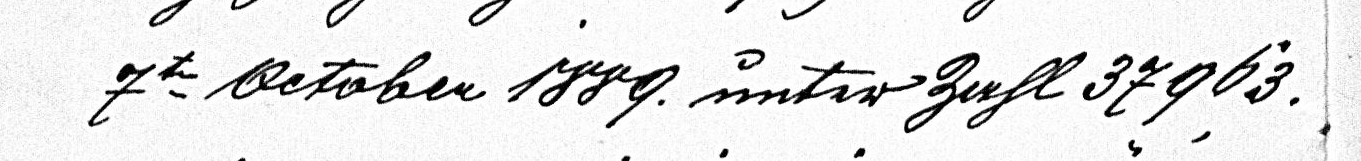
7ten October 1889. unter Zahl 37963.
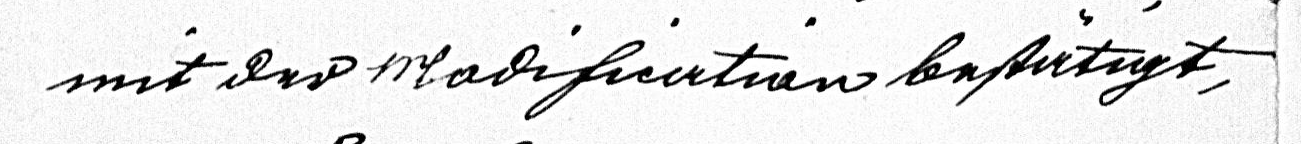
mit der Modification bestätigt,
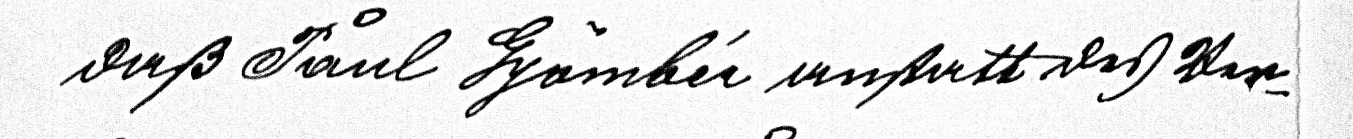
daß Paul Gyömbér anstatt des Ver¬
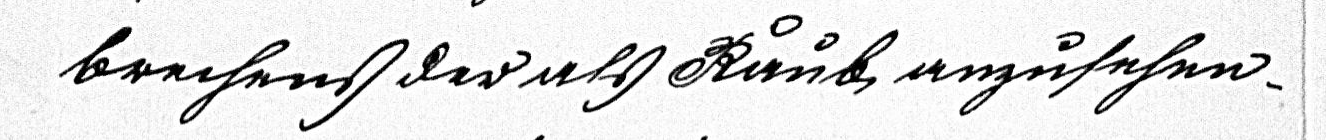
brechens der als Raub anzusehen¬
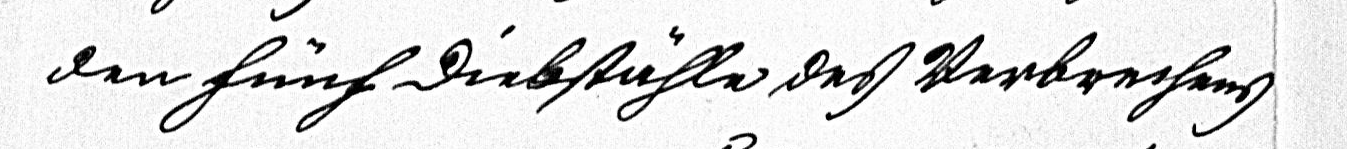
den fünf Diebstähle des Verbrechens
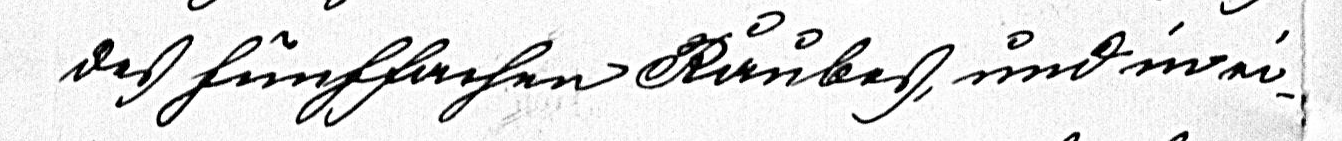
des fünffachen Raubes, und in ei¬
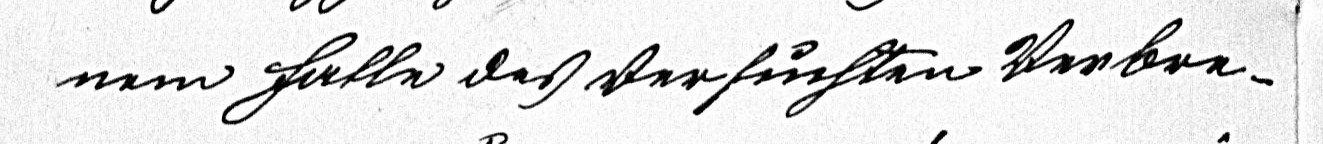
nem falle des versuchten Verbre¬
